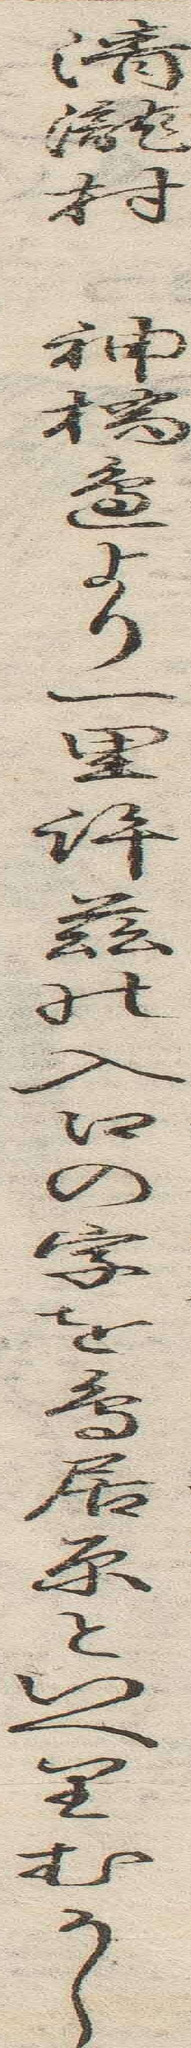清瀧村神橋邊より一里許兹の入口の字を鳥居原といへりむかし
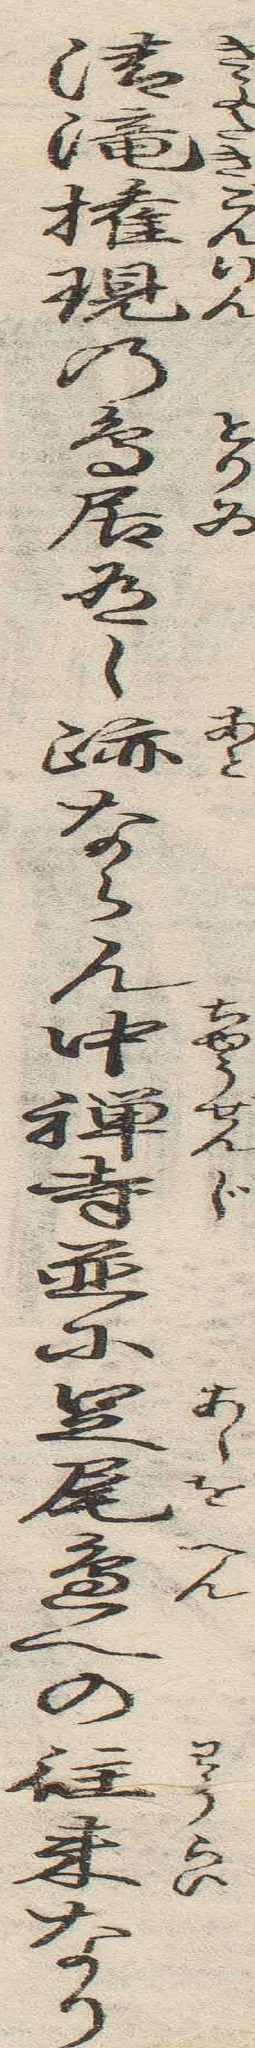清滝権現の鳥居有し跡ならん中禅寺並に足尾邊への往來なり
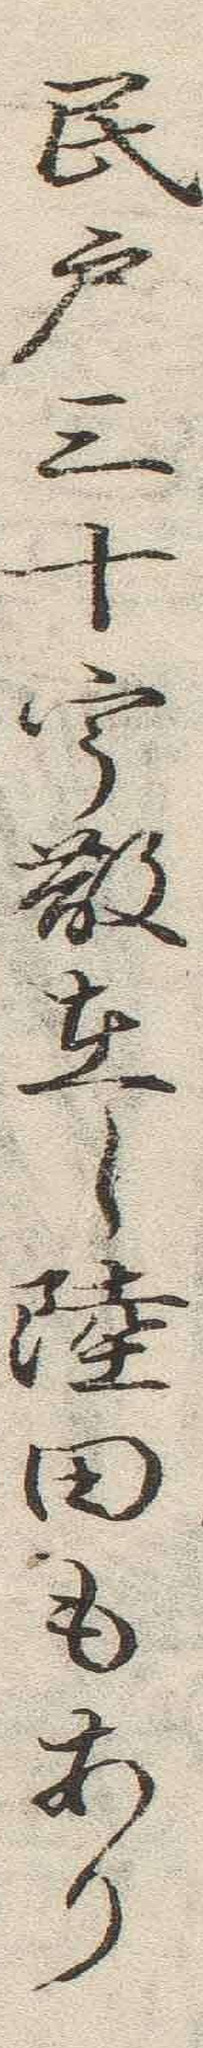民戸三十宇散在し陸田もあり
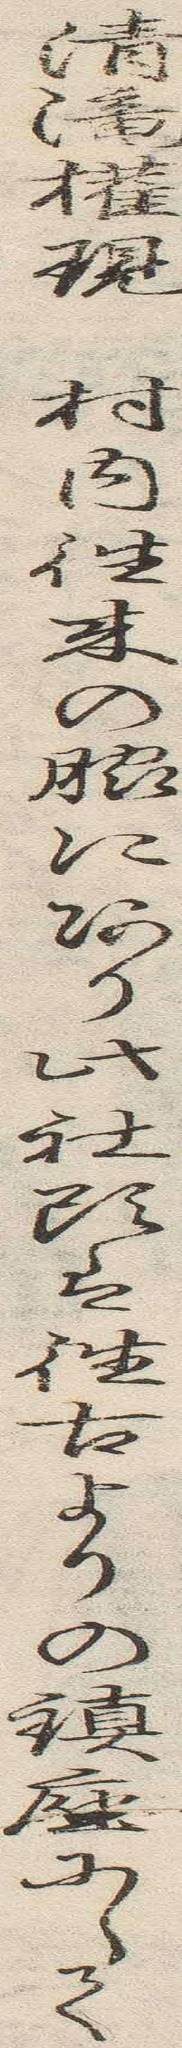清滝權現村内徃來の脇にあり此社頭は徃古よりの鎮座にして
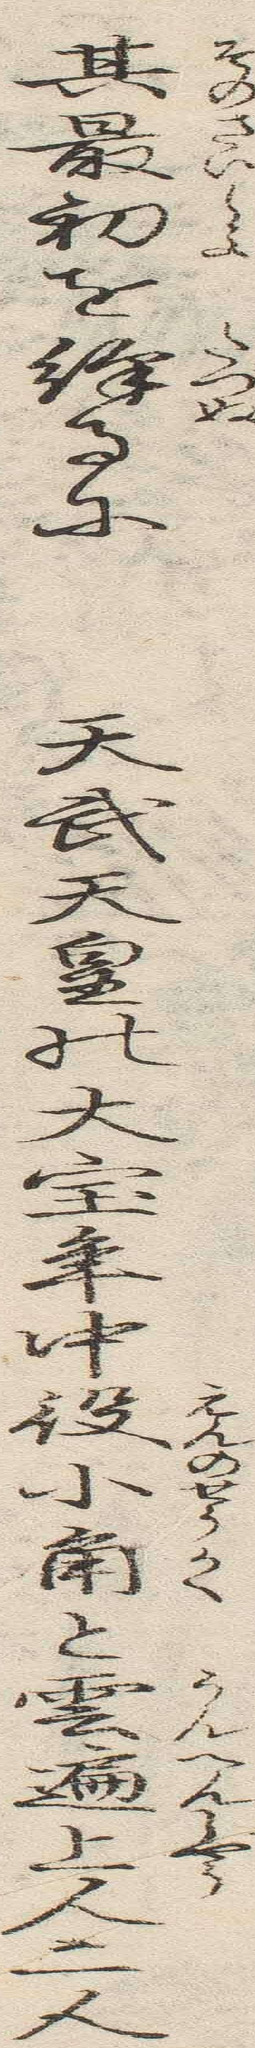其最初を繹るに天武天皇の大宝年中役小角と雲遍上人二人
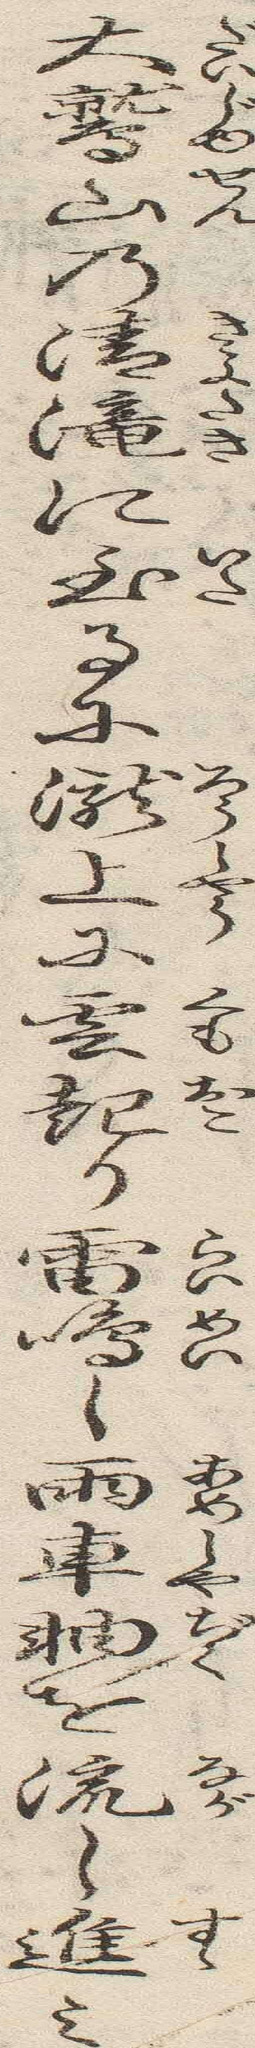大鷲山の清滝に至るに瀧上に雲起り雷鳴し雨車軸を流し進み
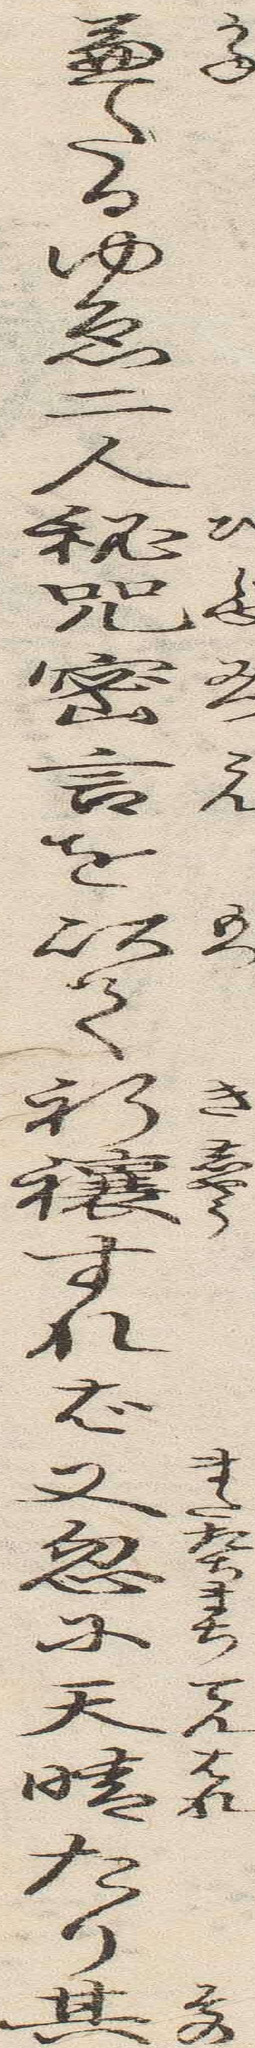兼たるゆゑ二人秘咒密言を以て祈穰すれば又忽に天晴たり其
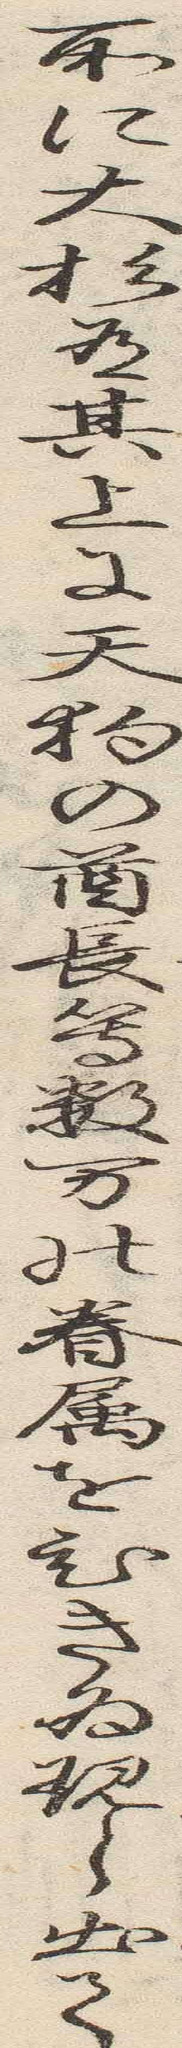所に大杉有其上に天狗の酋長等数万の眷属をひきゐ現し出て
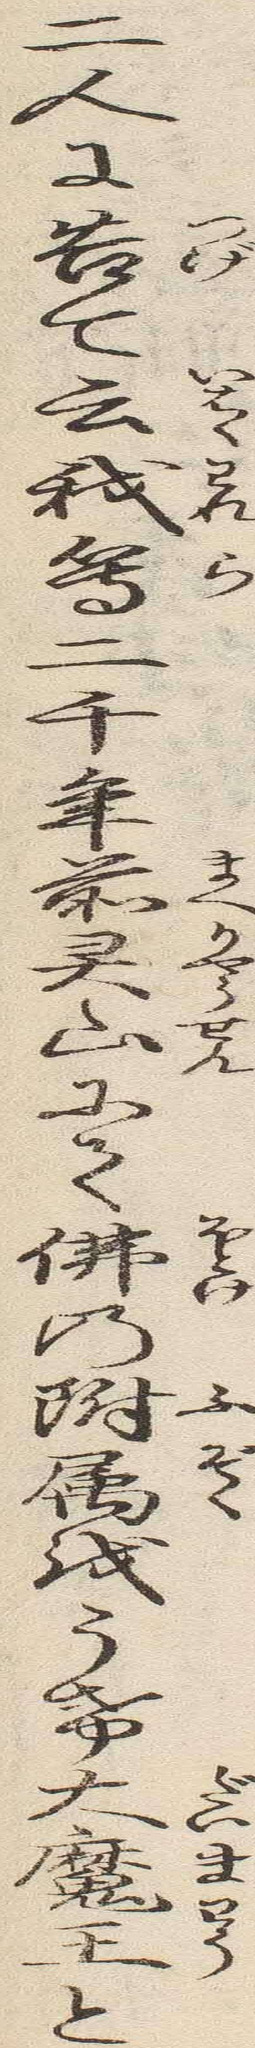二人に告て云我等二千年前㚑山にて佛の附属をうけ大魔王と
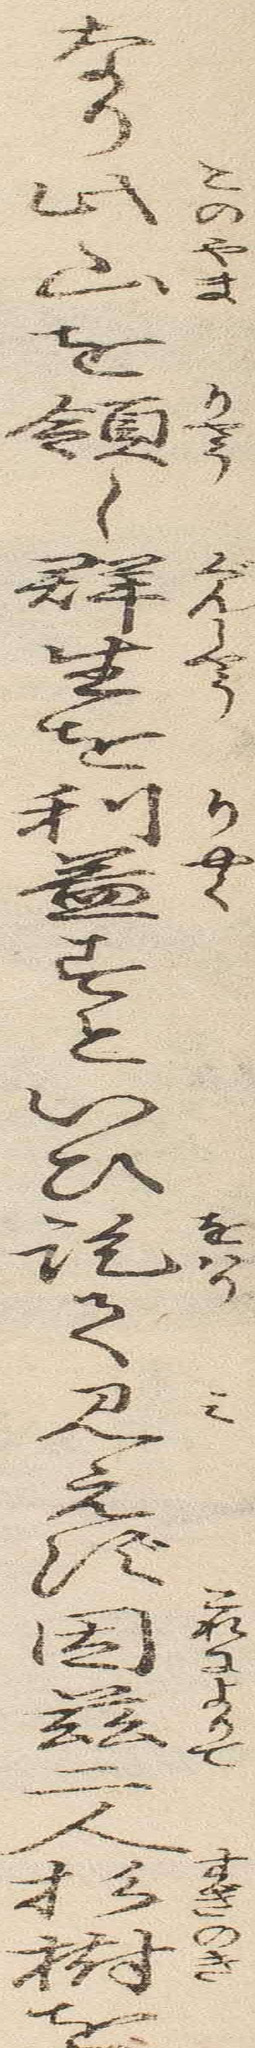なり此山を領し群生を利益すといひ説て見えず因兹二人杉樹を
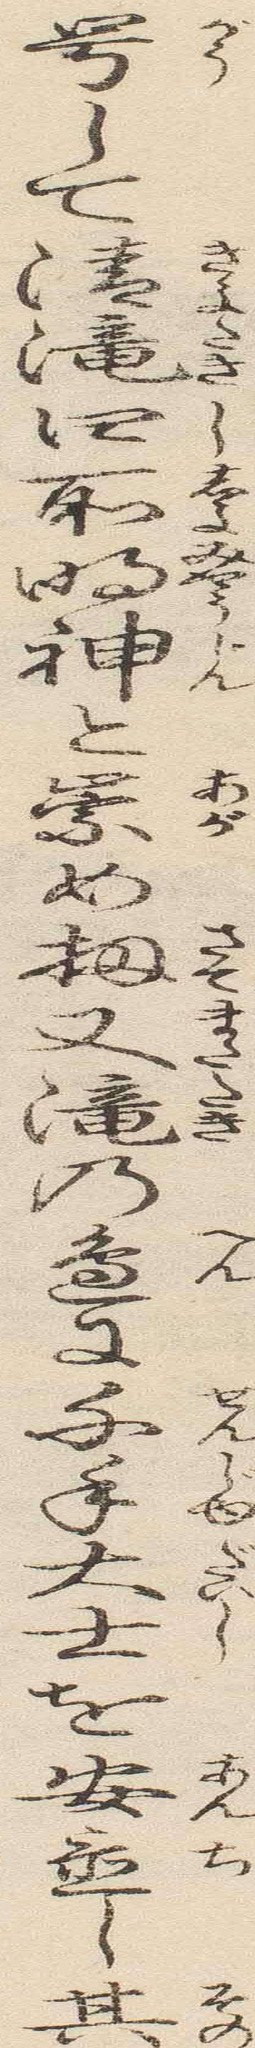号して清滝四所明神と崇め扨又滝の邊に千手大士を安置し其
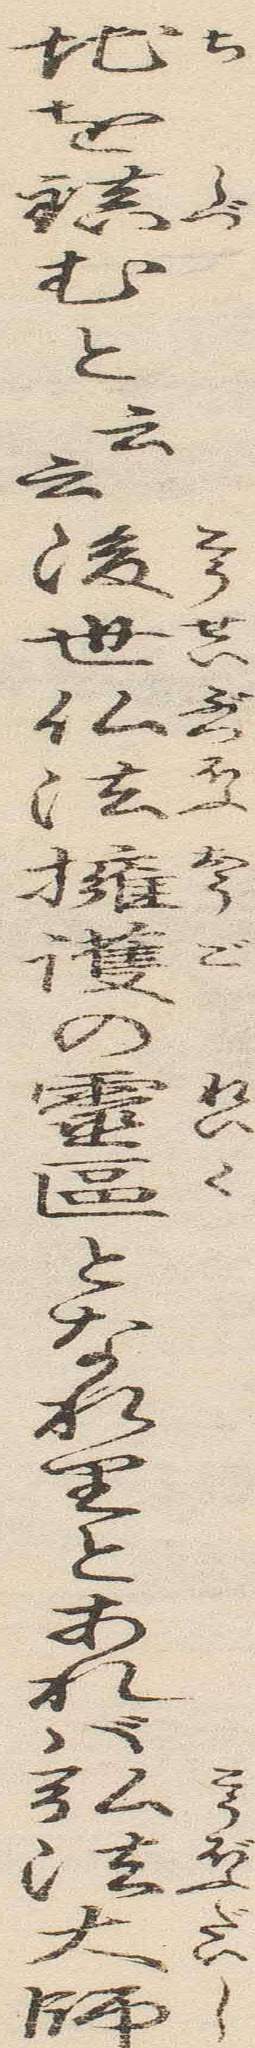地を鎮むと云云後世仏法擁護の靈區となれりとあれば弘法大師
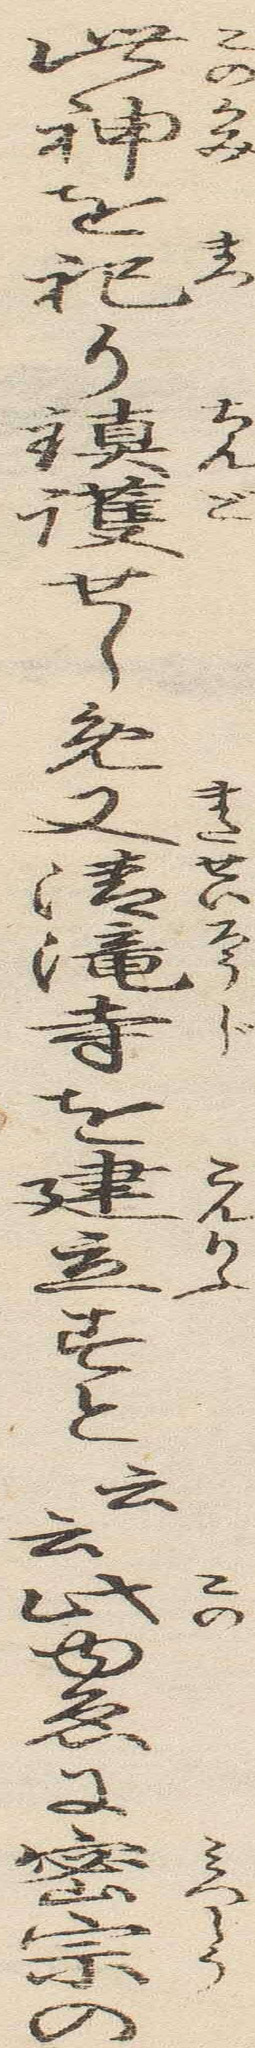此神を祀り鎮護せしめ又清滝寺を建立すと云云此ゆゑに密宗の
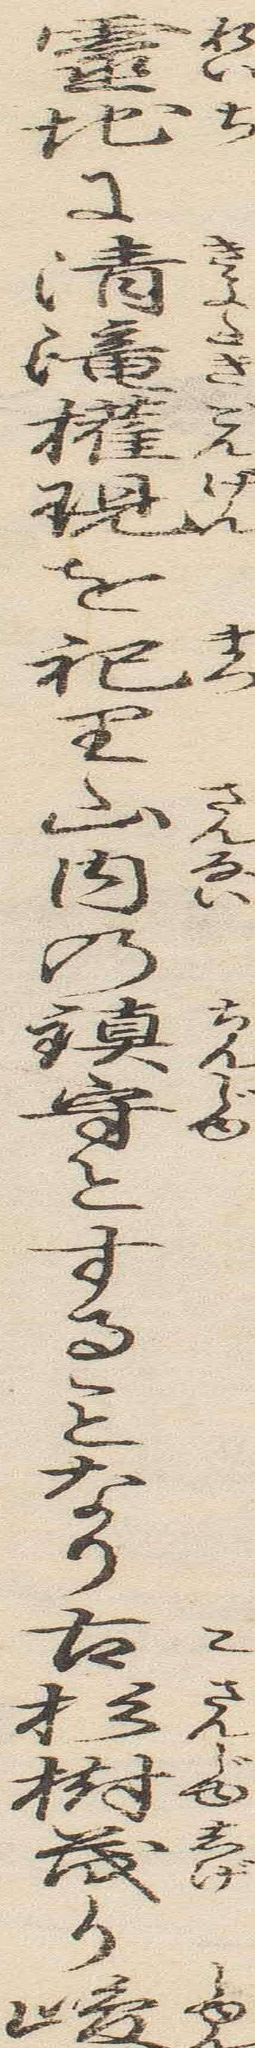靈地に清滝權現を祀り山内の鎮守とすることなり古杉樹茂り峻
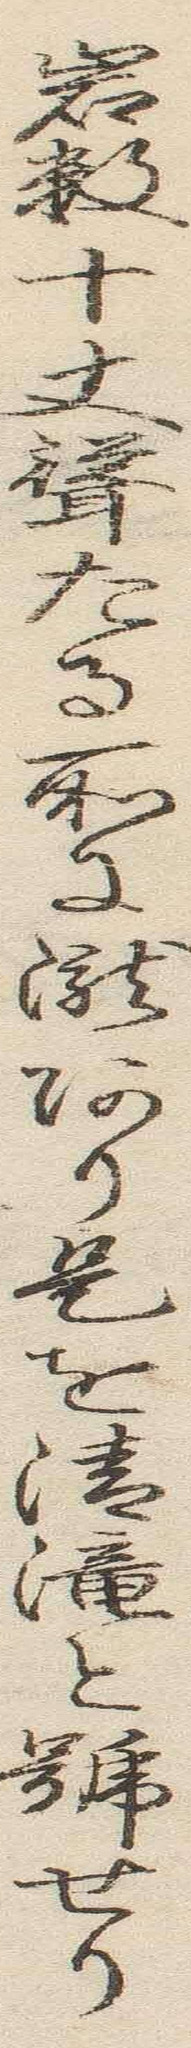岩数十丈聳たる所に瀧あり是を清滝と號せり
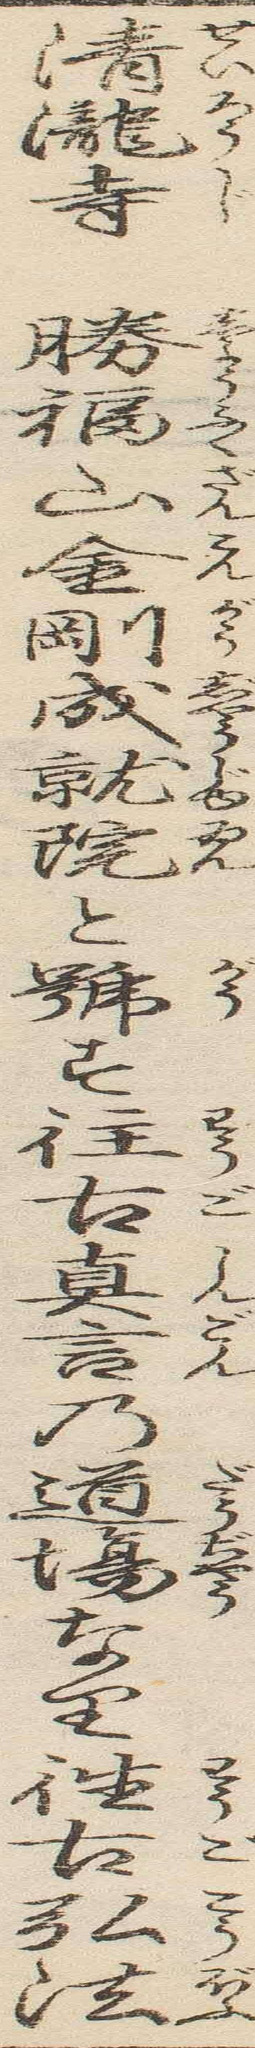清瀧寺勝福山金剛成就院と號す往古真言の道塲なり徃古弘法
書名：日光山志
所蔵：東京学芸大学附属図書館 国文学研究資料館
